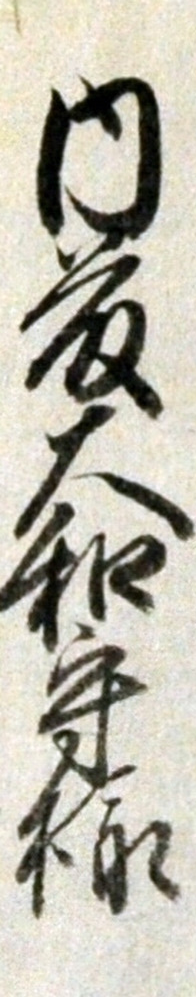内藤大和守様
